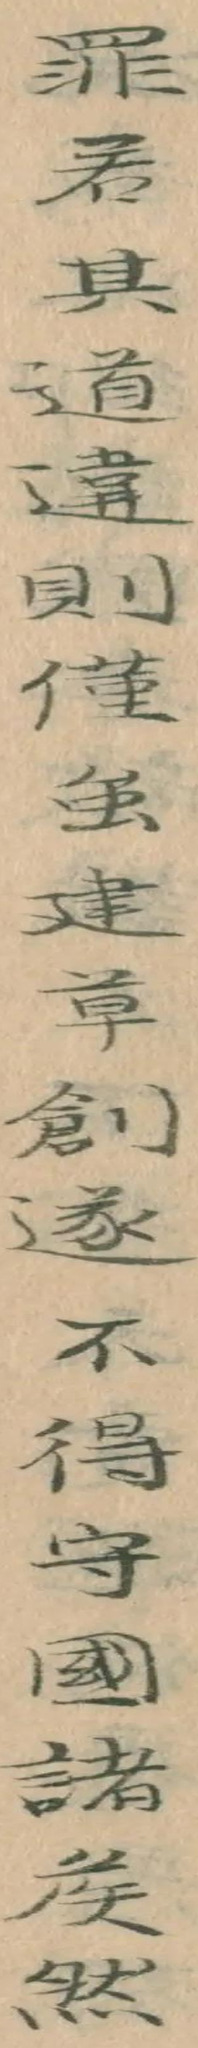罪若其道違則僅雖建草創遂不得守国諸疾然

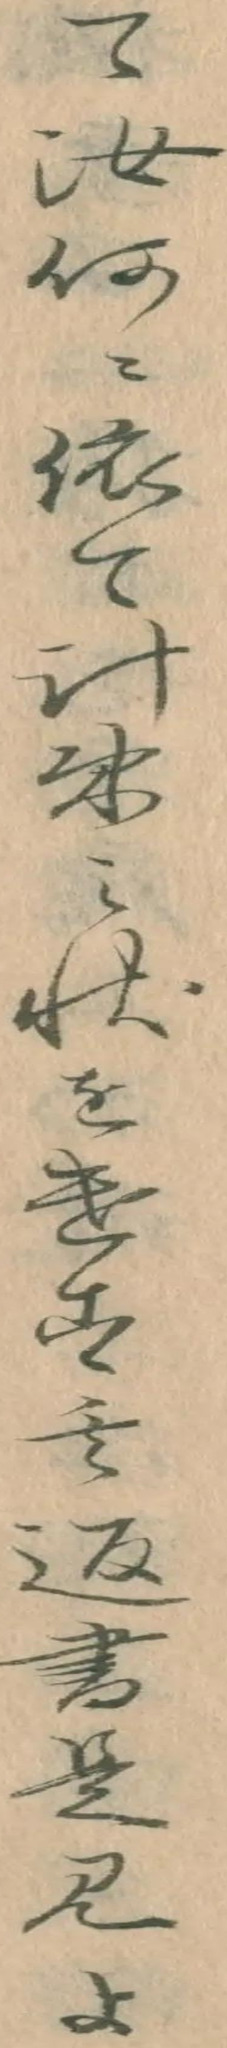て汝何に依て計束之状を遣春其返書是見よ
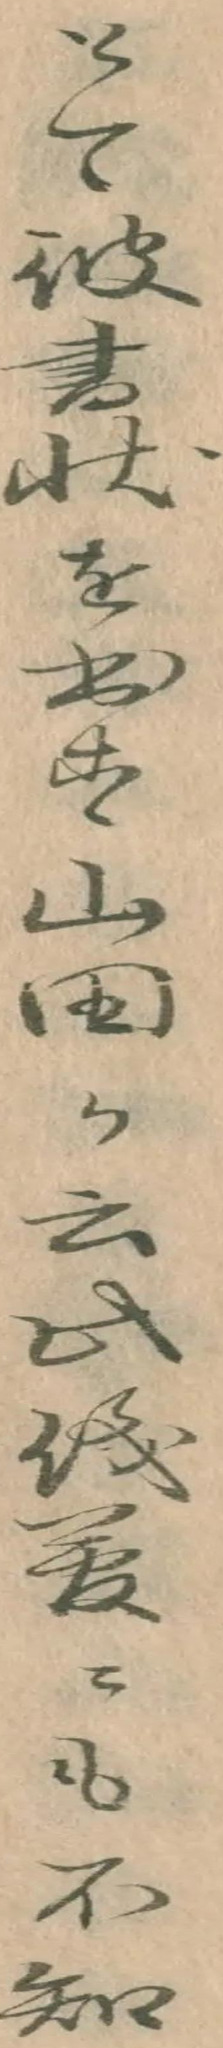とて彼書状を出春山田か云此儀曾にも不知
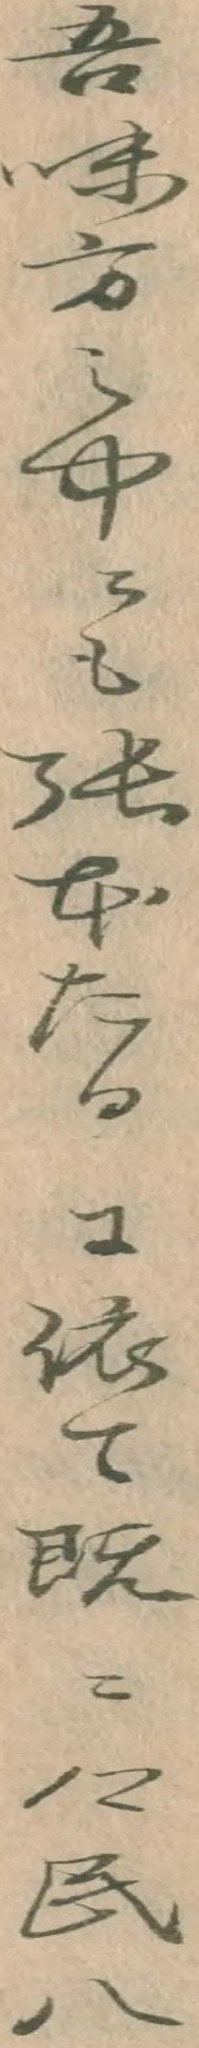吾味方之中にも張本たる尓依て既に郷民八
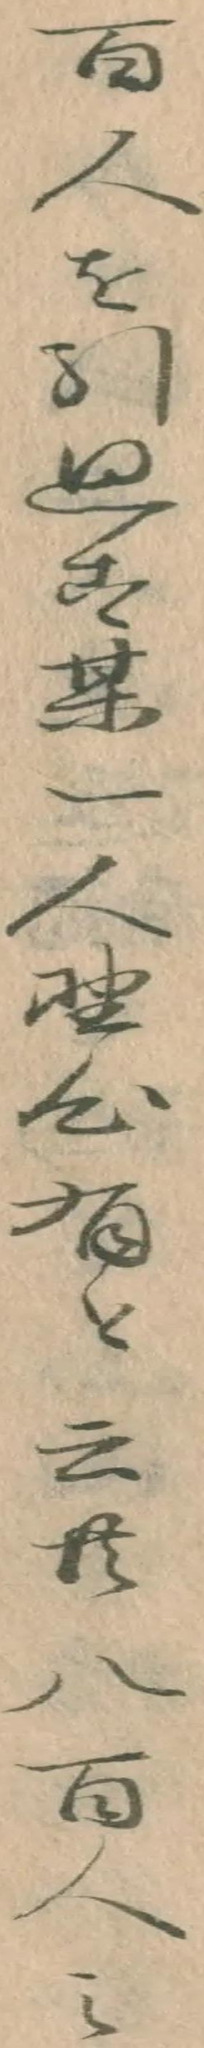百人を引廻春某一人野心有と云共八百人之
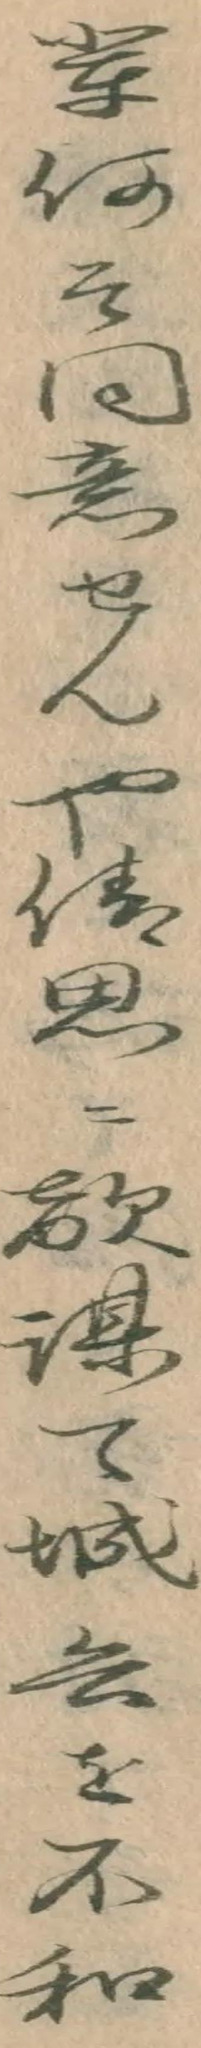輩何そ同意せんや倩思に敵謀て城兵を不知
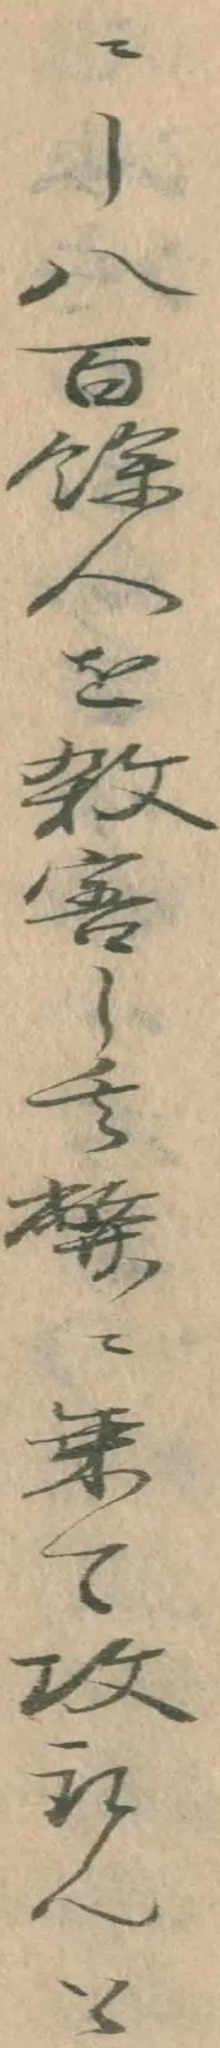にし八百余人を殺害し其幣に乗て攻取んと
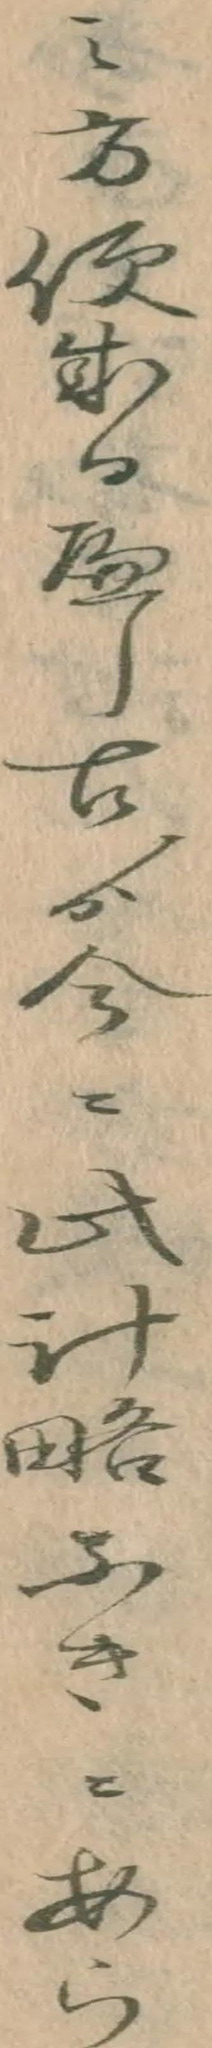之方便成る扁し古ゟ今に此計略なきにあら
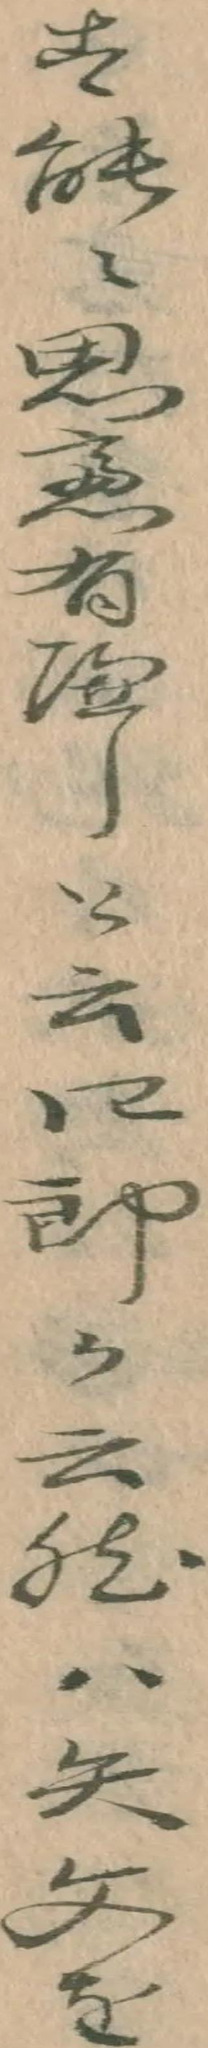春能々思慮有扁しと云四郎か云然は矢文を
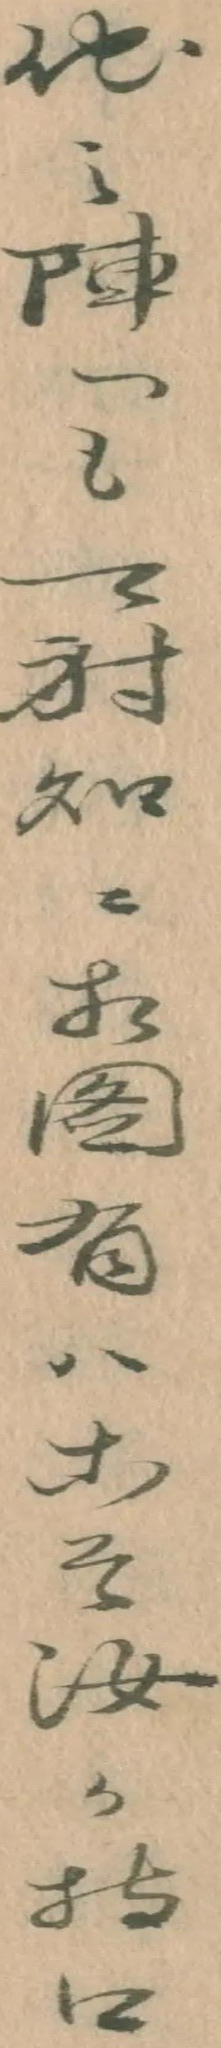他之陣へも可射処に相図有は古そ汝か持口
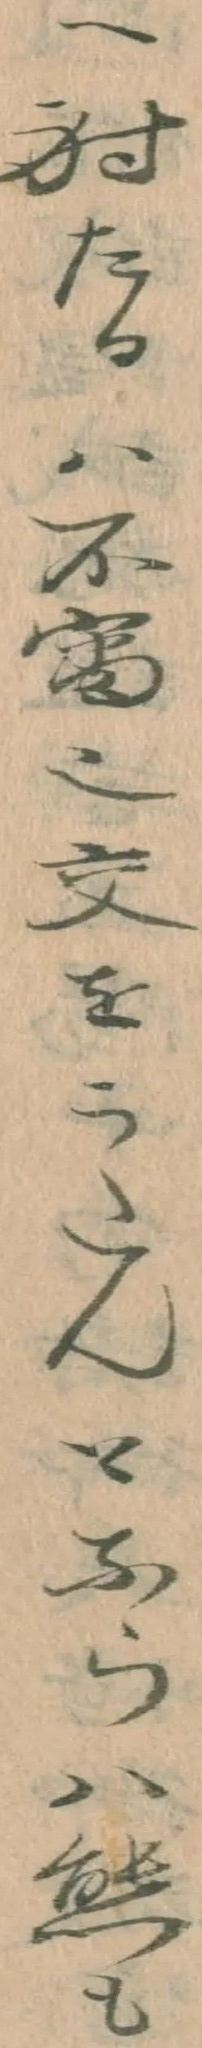へ射たるは不審也文をうたんとならは熊も
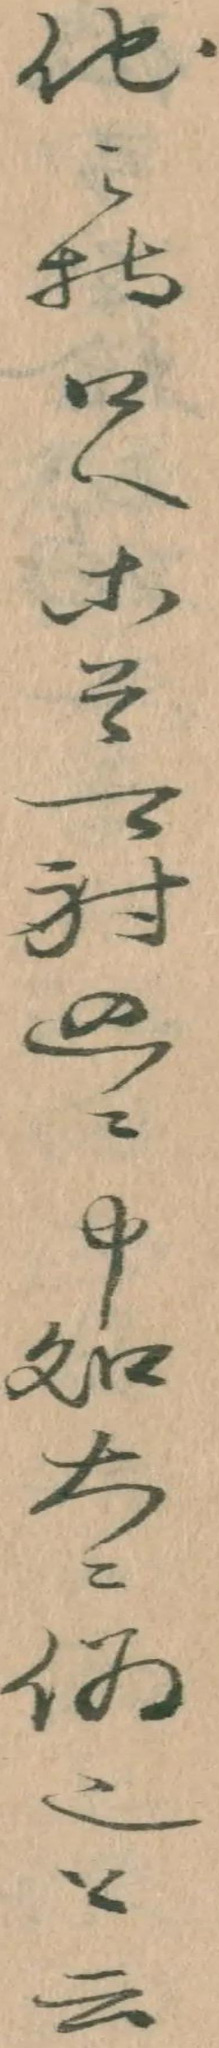他之持口へ古そ可射込に申処大に偽也と云
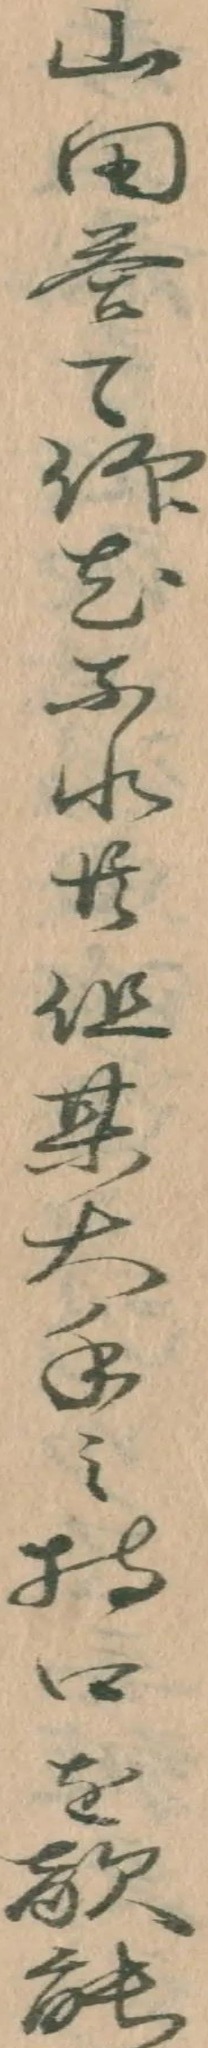山田答て仰尤なれ共但某大手之持口を敵能
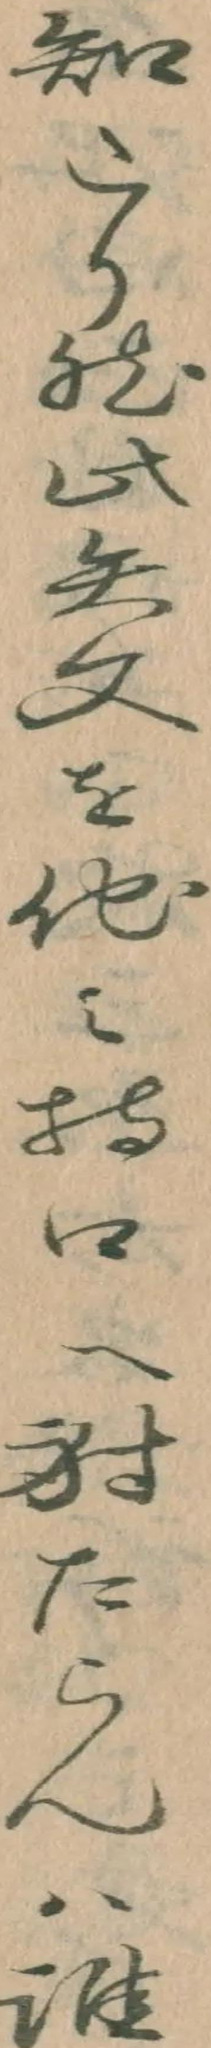知たり然此矢文を他之持口へ射たらんは誰
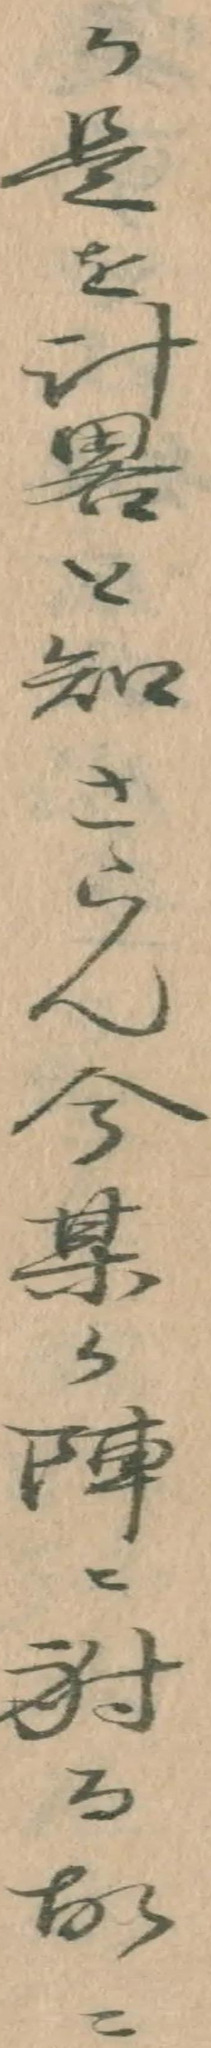か是を計略と知さらん今某か陣に射る故に
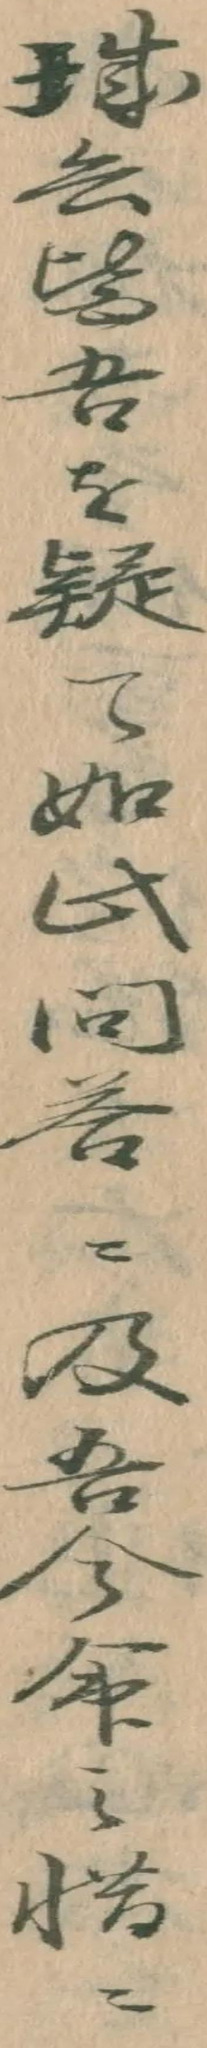城兵皆吾を疑て如此問答に及吾今命之惜に
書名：切支丹御退治記 49巻. [6]
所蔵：国立国会図書館 National Diet Library, JAPAN
